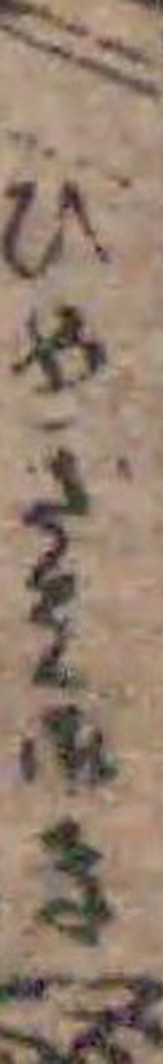ひめぎみ御き
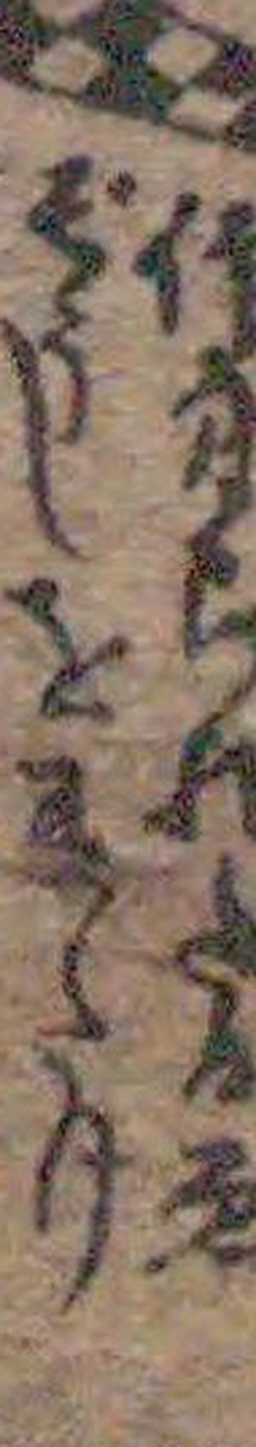ぞうしを有たけ
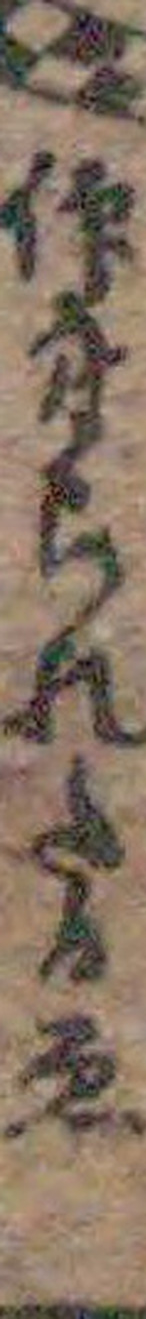仰付られたるゑ
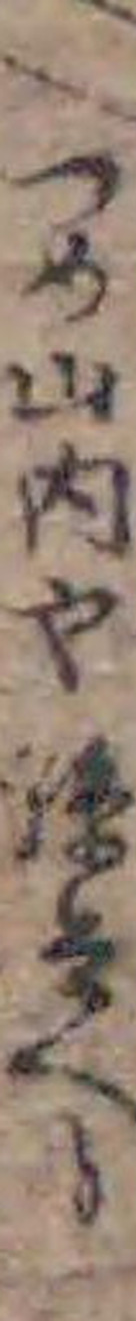つめ山内や孫兵へも
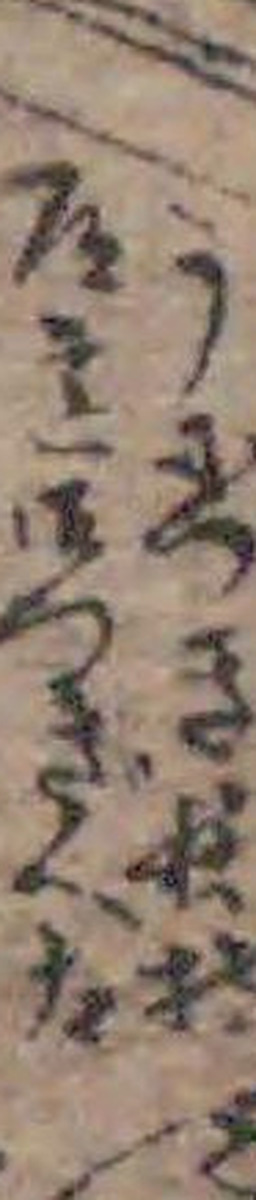道意御つぎへ御
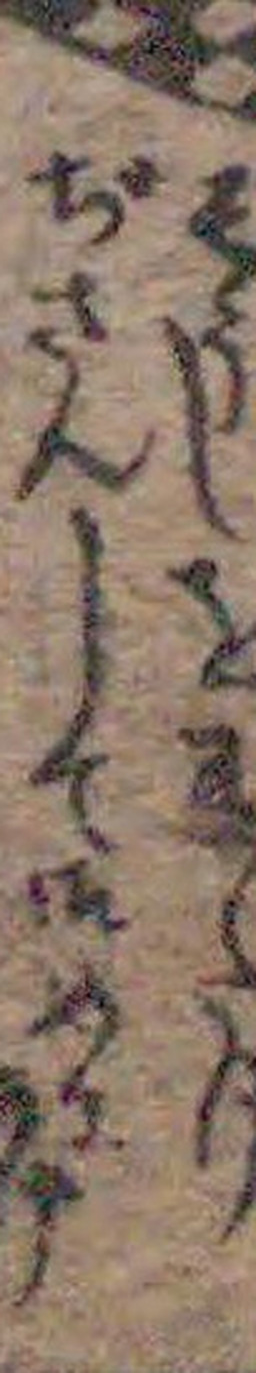ぢさんして御つめかけ
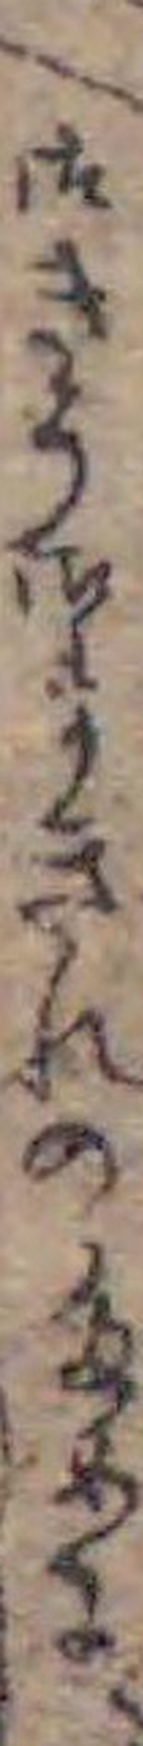御きう御まぎれのために
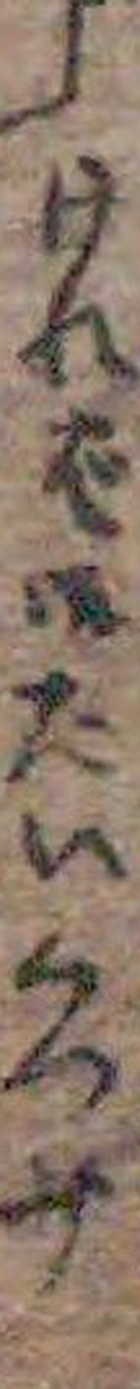ければ御たいくつ少
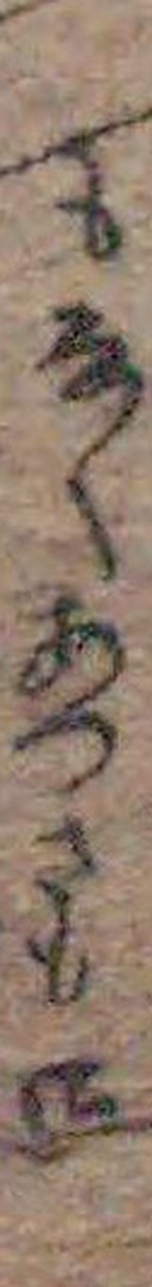もなくあつさも御
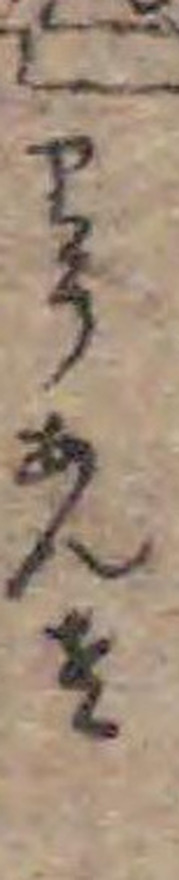りうあん殿
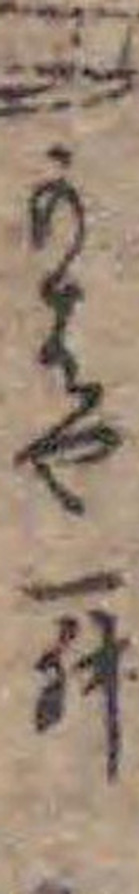もはや一舛
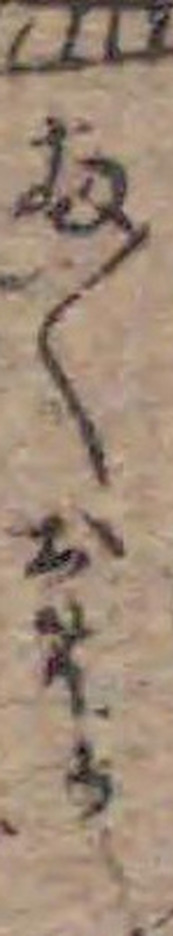扨〳〵おはか
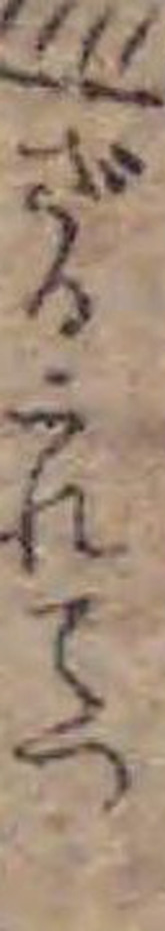ざるこれてつ
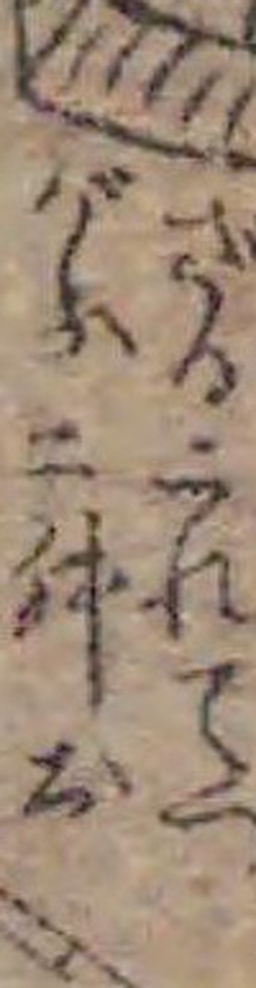がふ二舛お
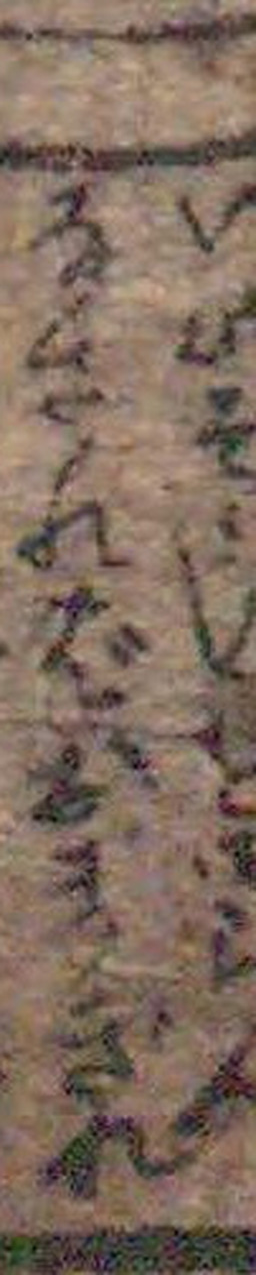なさればおまぎれ
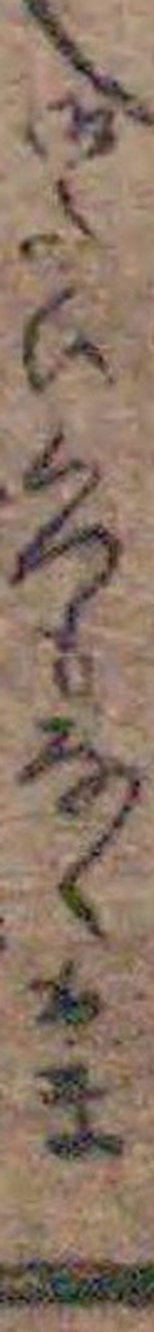御たいくつもなくおま
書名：三舛増鱗組 : 3巻
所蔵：国立国会図書館 National Diet Library, JAPAN
